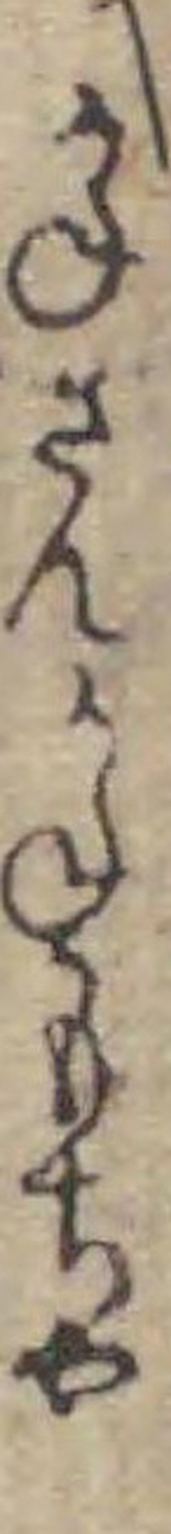〽かねさんかねもちや
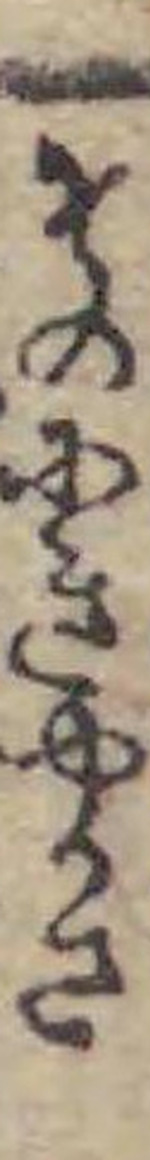そのにきやかさ
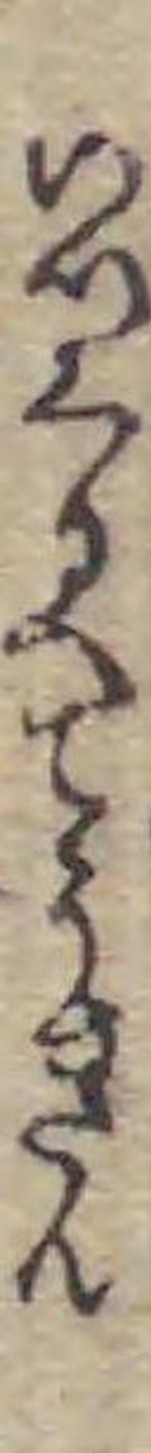いつくるへてうぎん
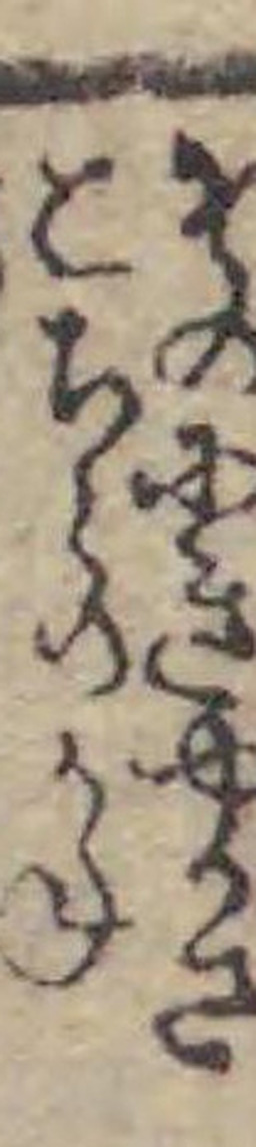こちらのかね
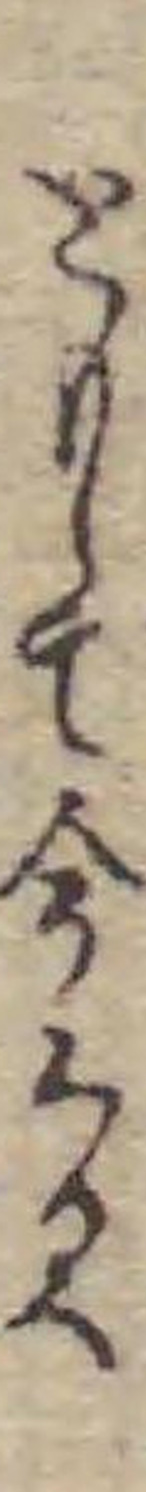ともして今くるへ
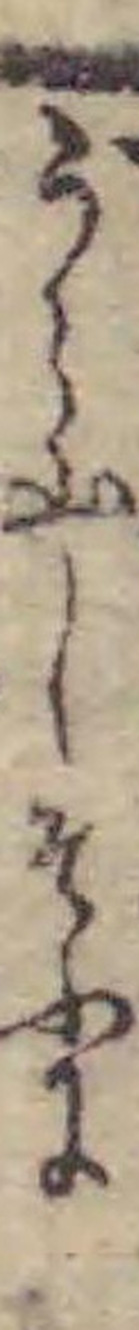うら山しそふに
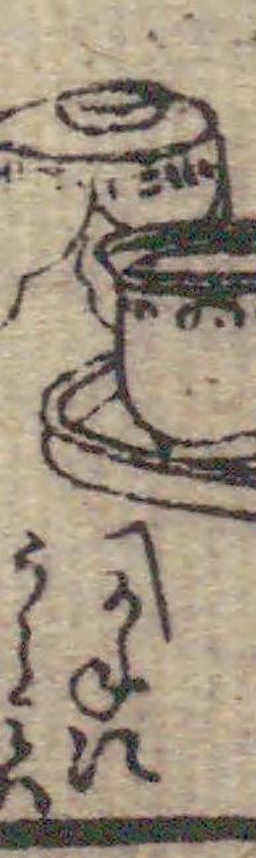〽かねに
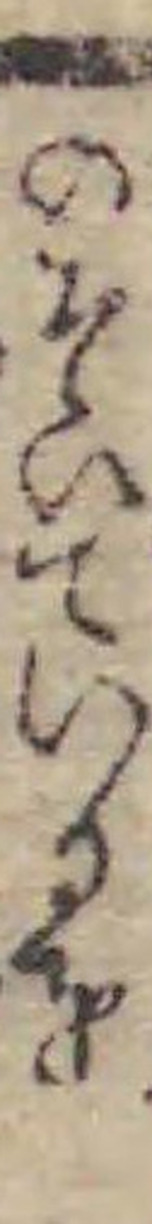のそいているを
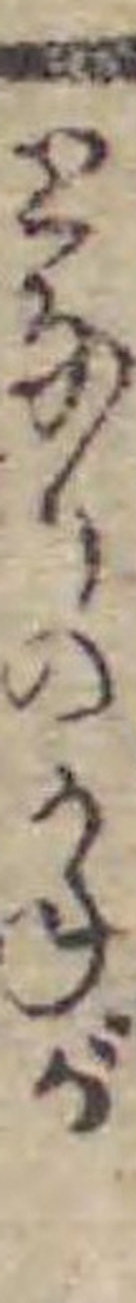となりのかねが
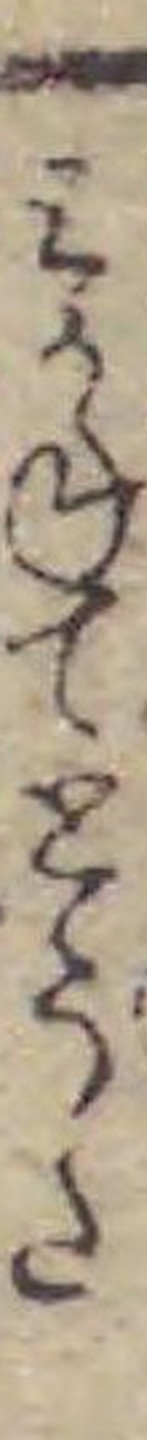みかねてとうた
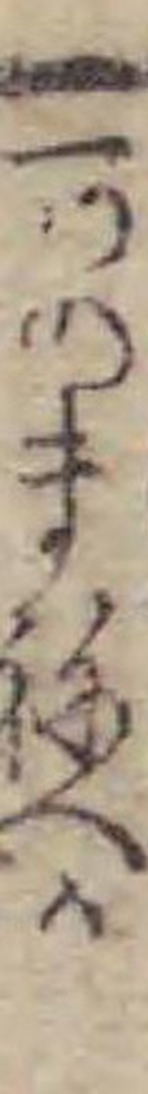一つのまねへか
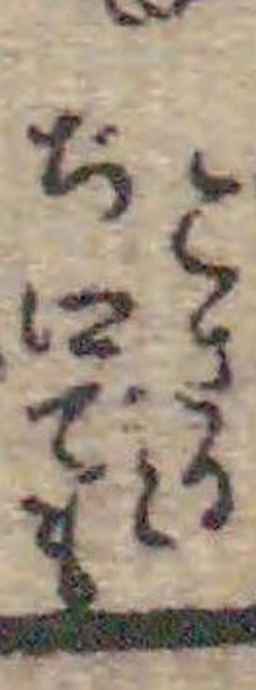ぢ口でも
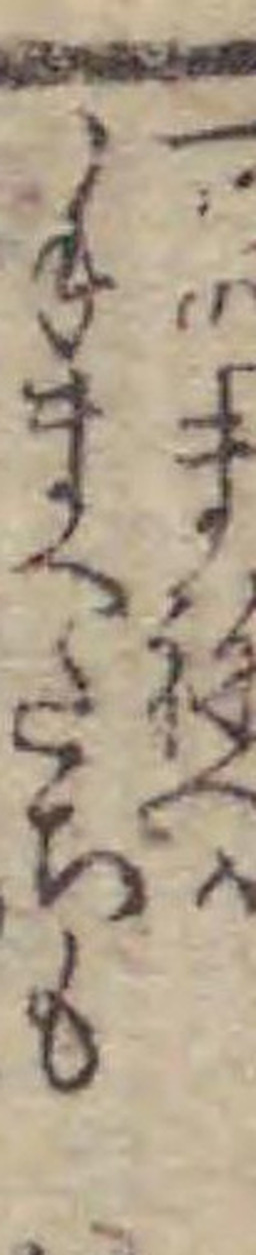手まへたちも
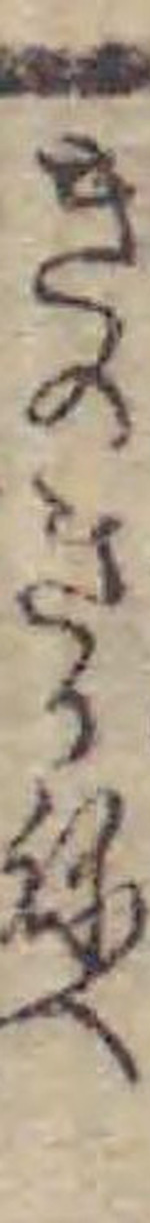きのきかねへ
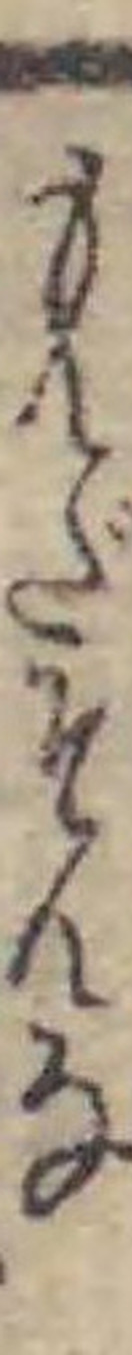もんだそんな
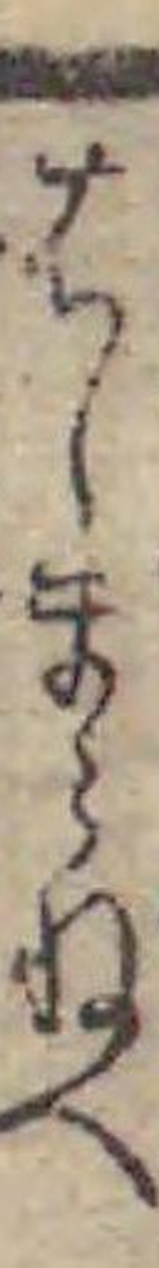はしまらねへ
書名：新鋳小判 : 3巻
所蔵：国立国会図書館 National Diet Library, JAPAN
